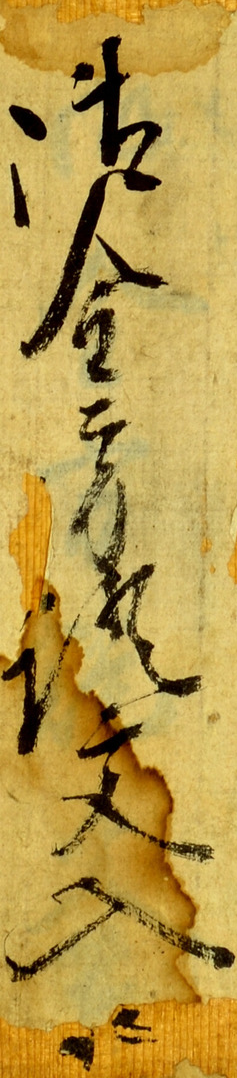御金方証文入
